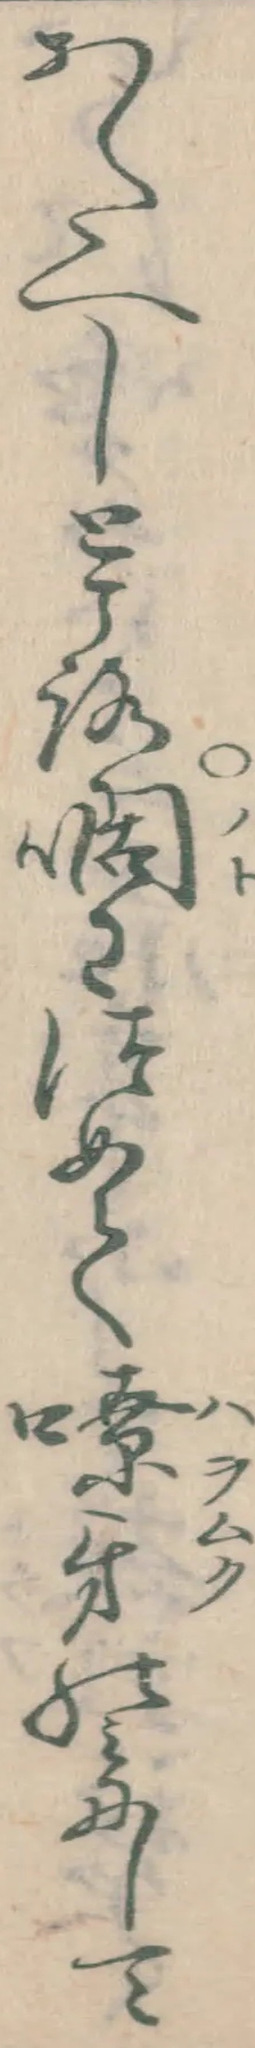あたへしところ。咽につめて嗓牙のみにして
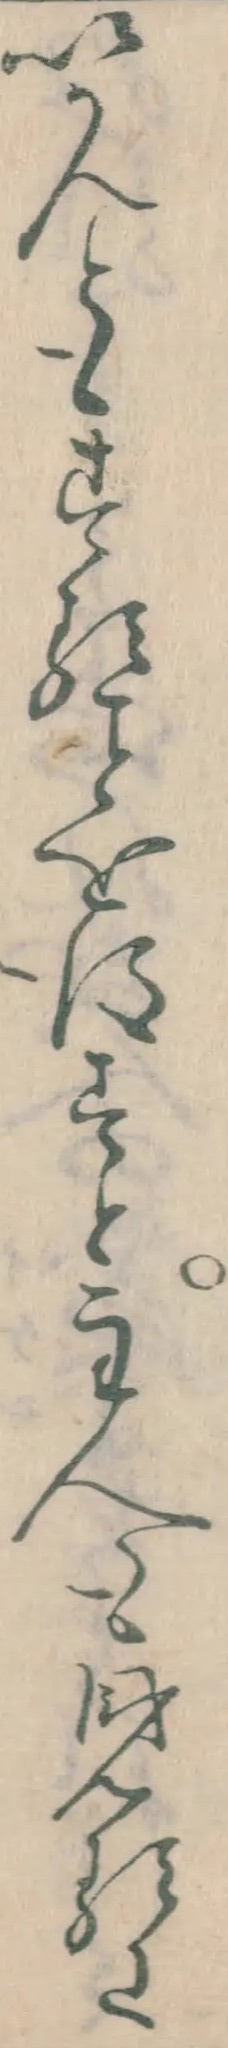いかんともすることを得すと。主人も見るに
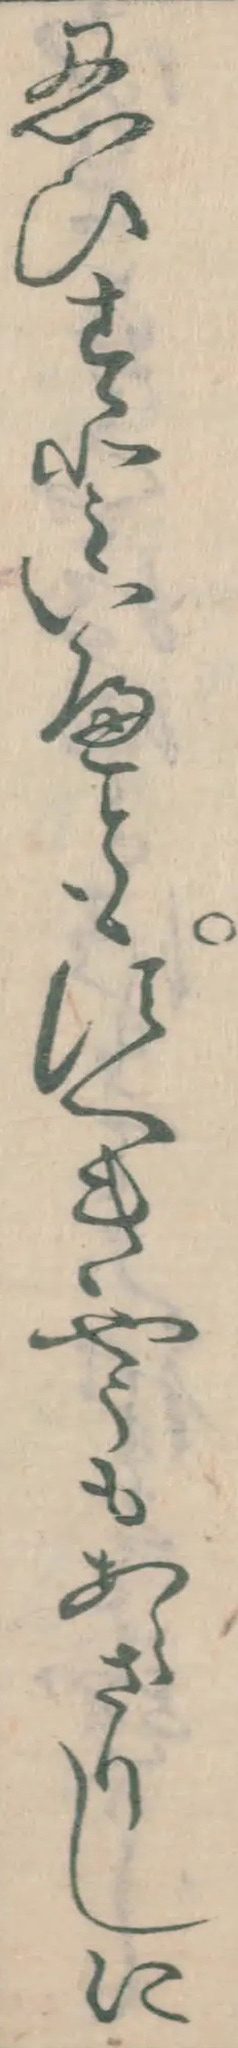忍ひすといへとも。すへきやうもあらさりしに
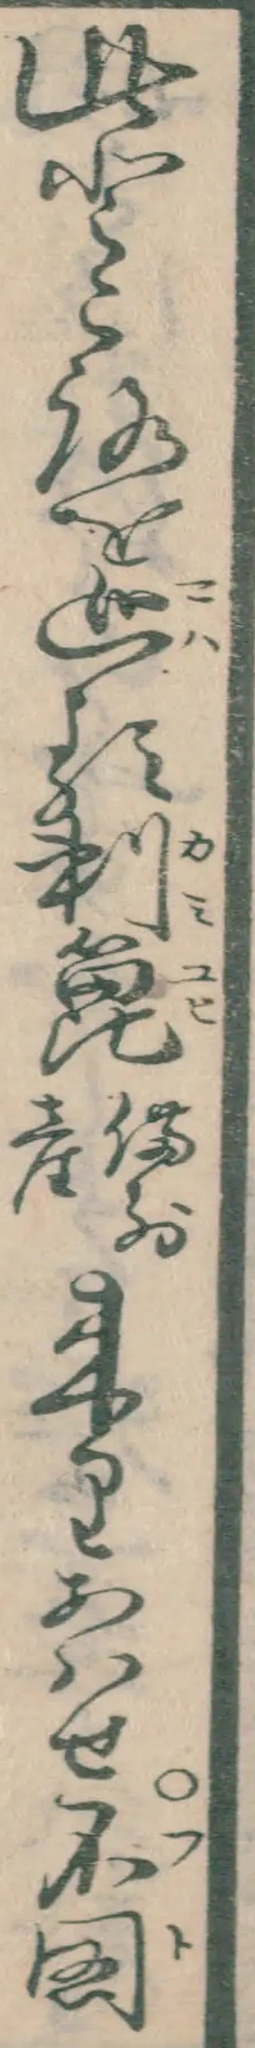此ところを廻る剃篦備前産来りあはせ。不図
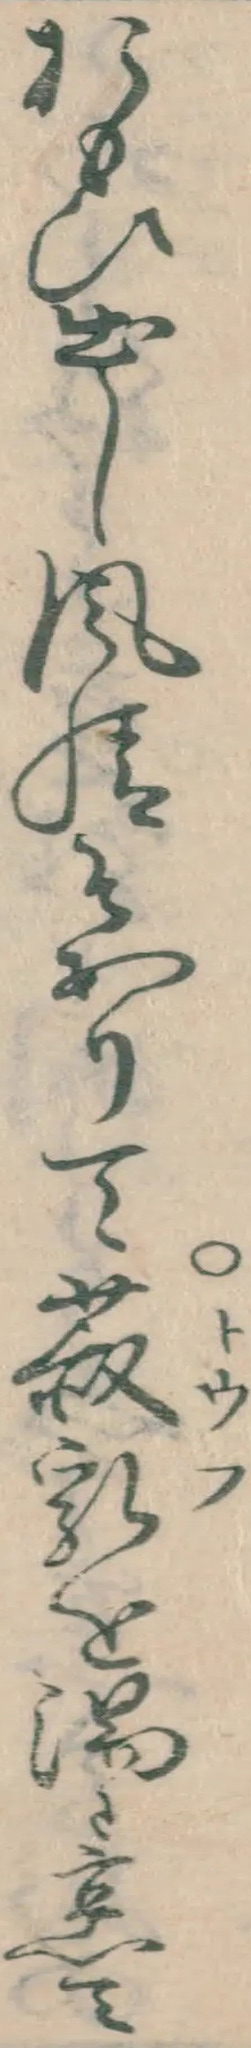おもひ出し風情そありて。菽乳を湯に烹て
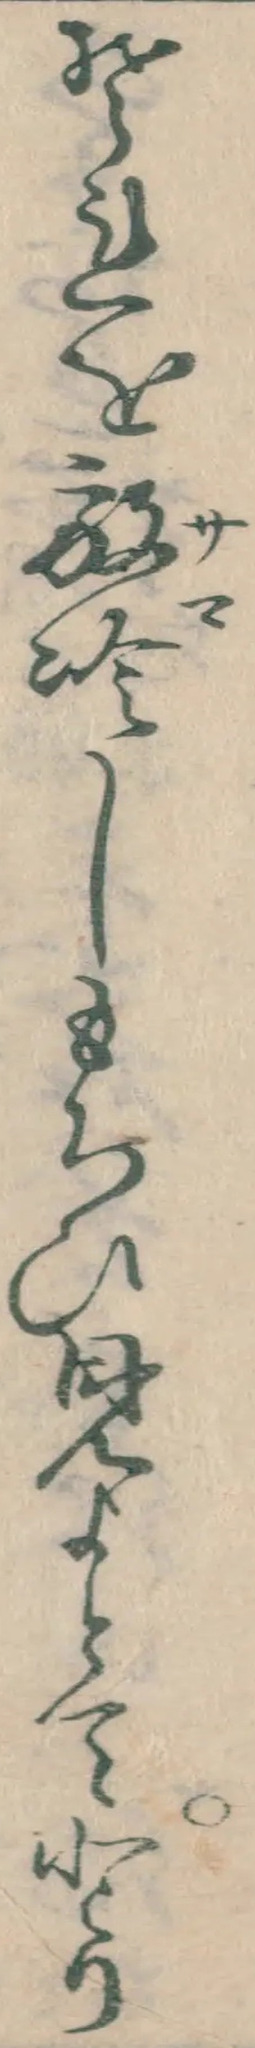それを放冷しもちひ見よとて。とり
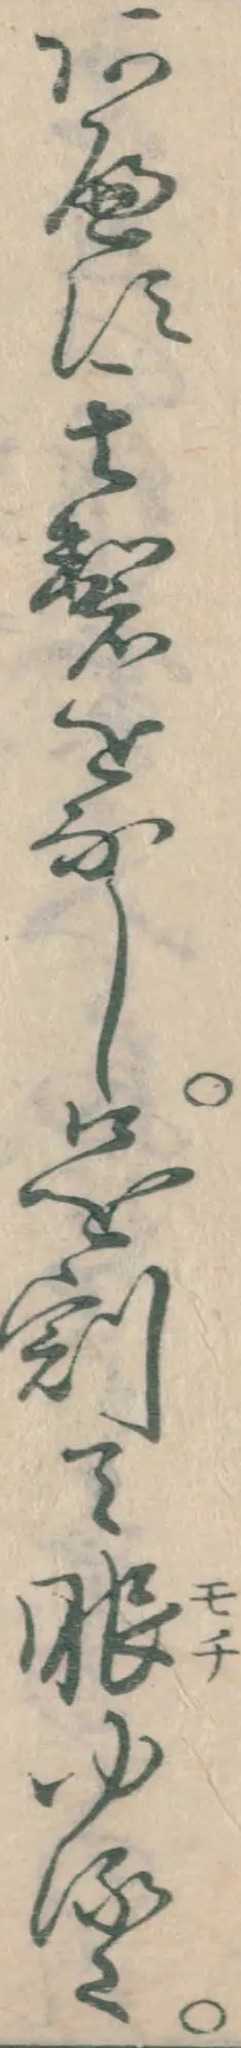あへす其製をなし。口を割て服ゆるに。
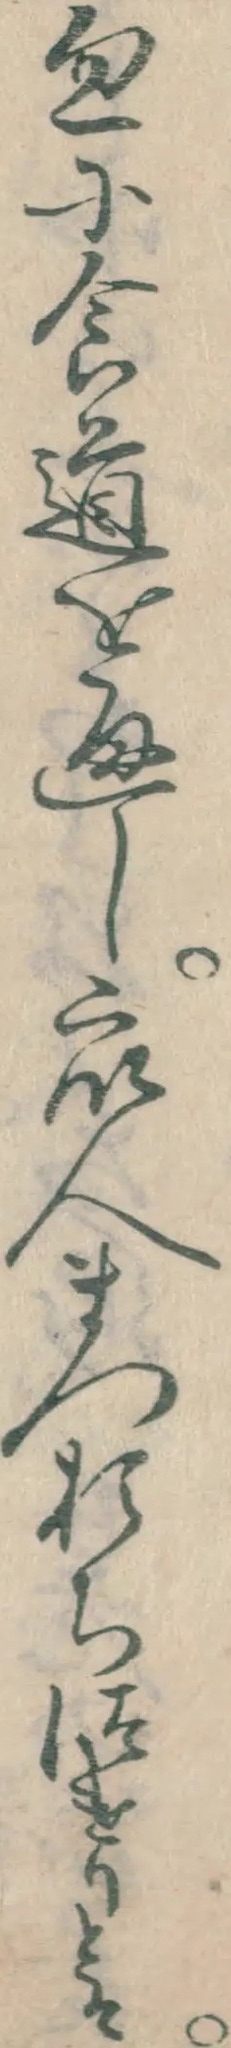忽に食道を通し。衆人まつおちつけりとそ。
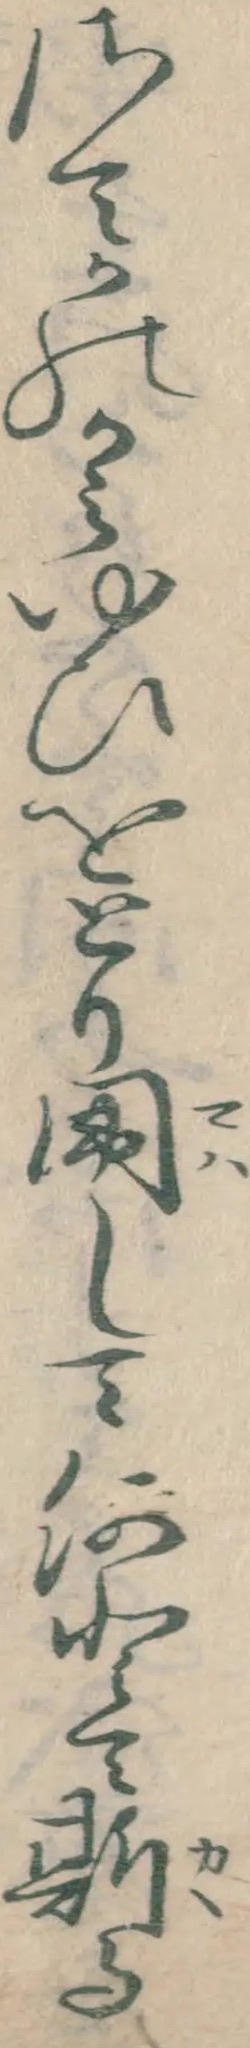さてかのかみゆひをとり囲して何とて斯る

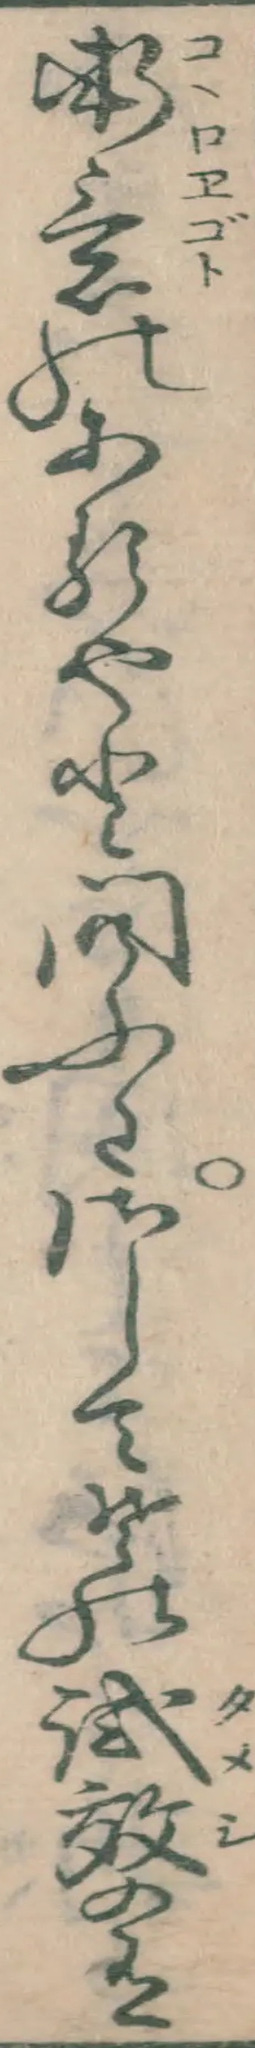術意のあるやと問ふに。さしてその試効の有
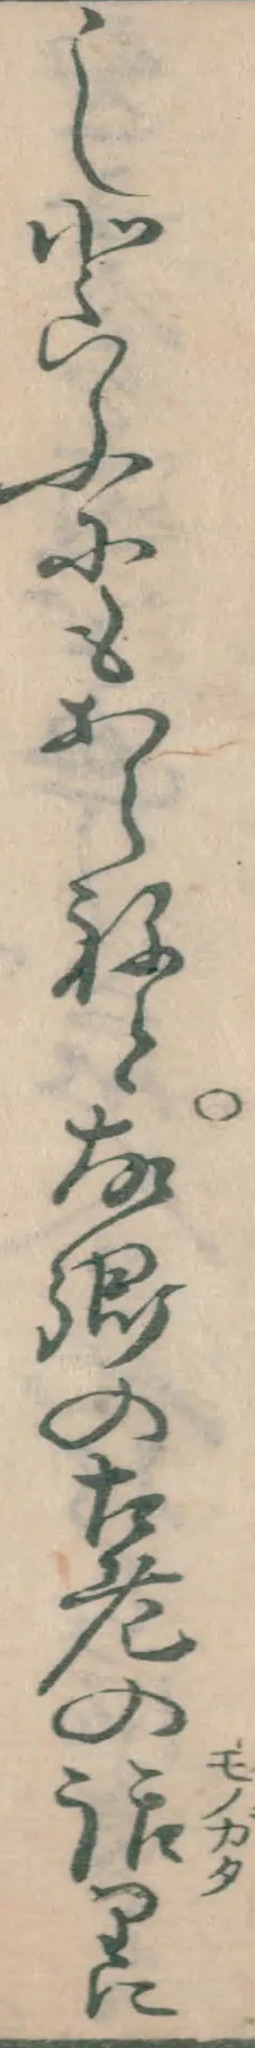しといふにもあらねと。故郷の古老の話りに
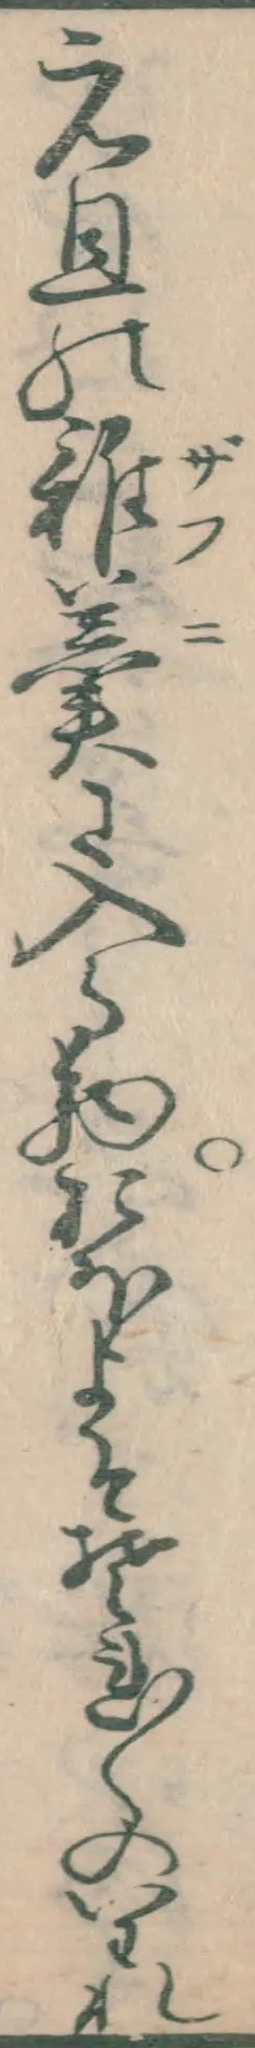元旦の雑羹に入る物。おほよそそれ〳〵のいわれ
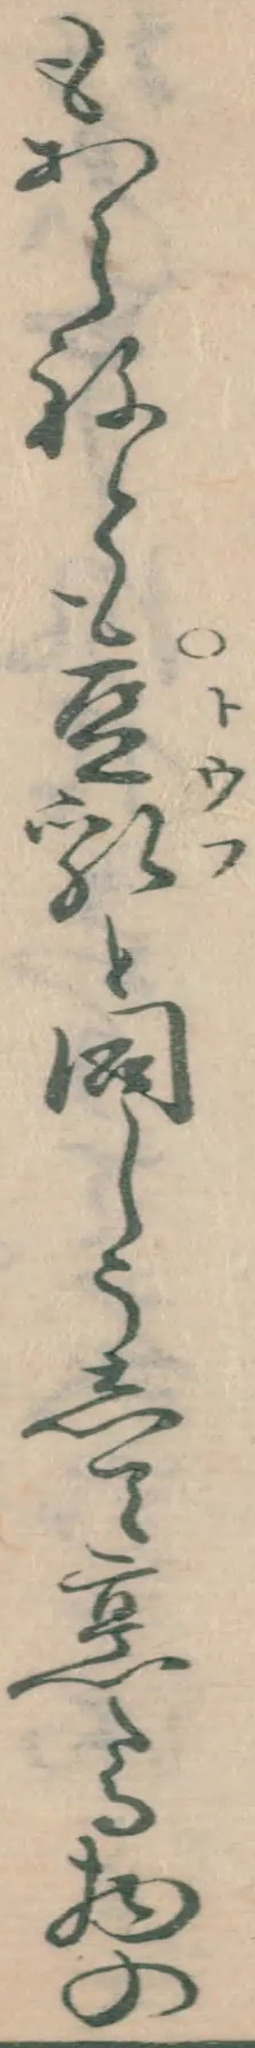もあらねとも。豆乳と同しうして烹たる物の
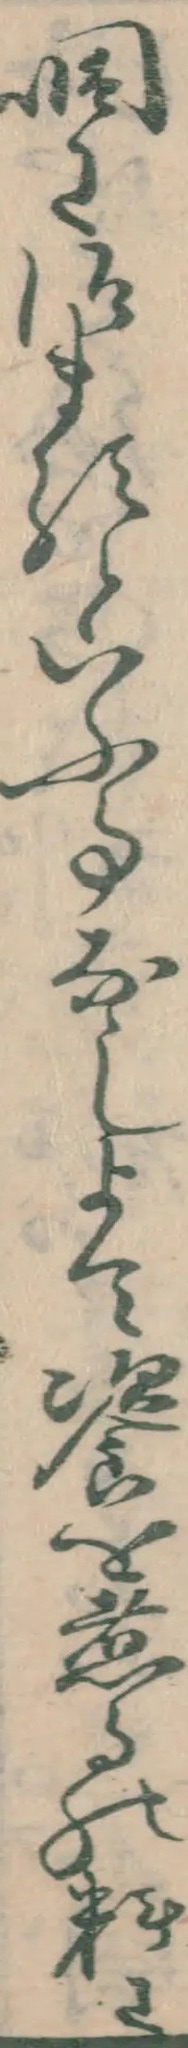咽につまるといふ事なし。よて餈を煮るの料に
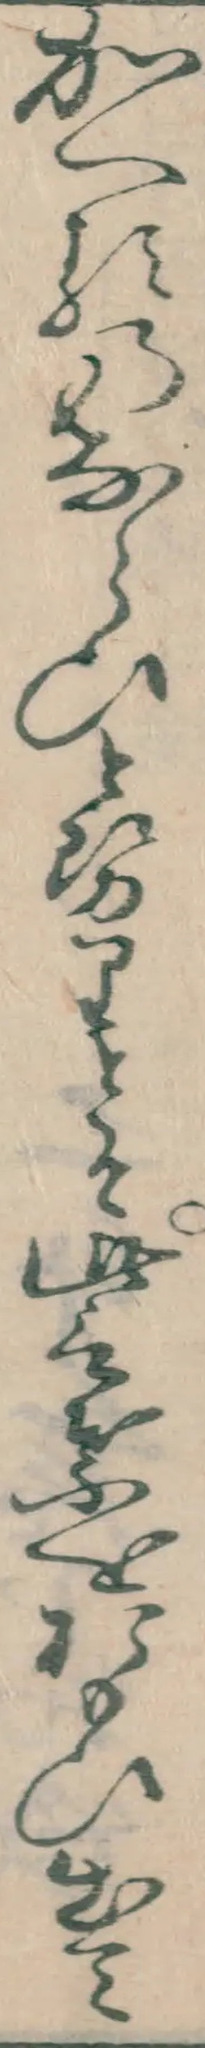加へるのならひとせりとそ。此言葉をおもひ出て
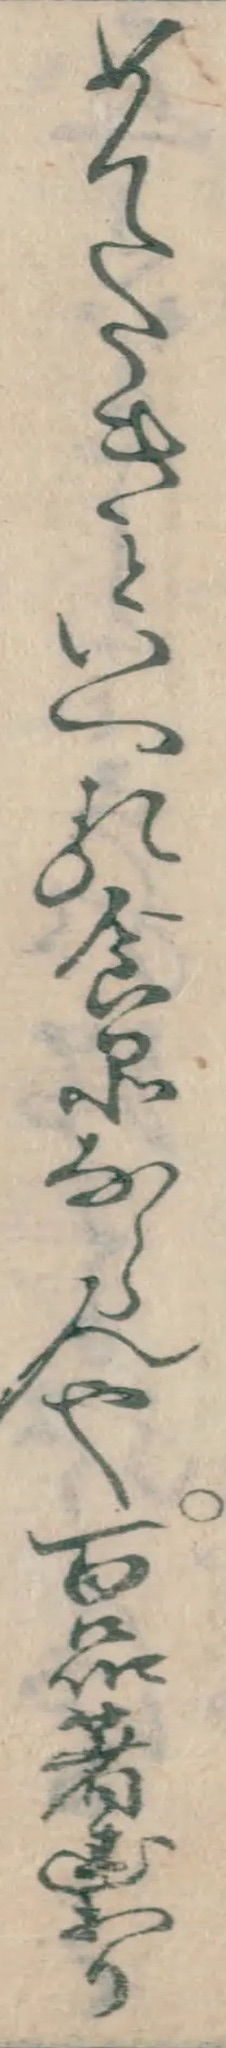めてたきといへる食品ならんや。百品著述あり
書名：豆腐百珍. 続編
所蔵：国立国会図書館 National Diet Library, JAPAN
